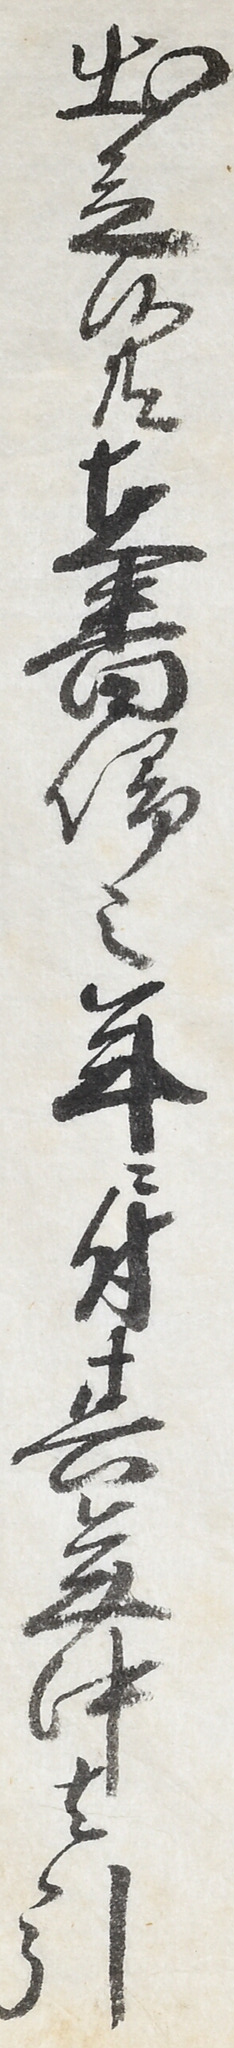出立候共在番帰之年ニ付其年中は引
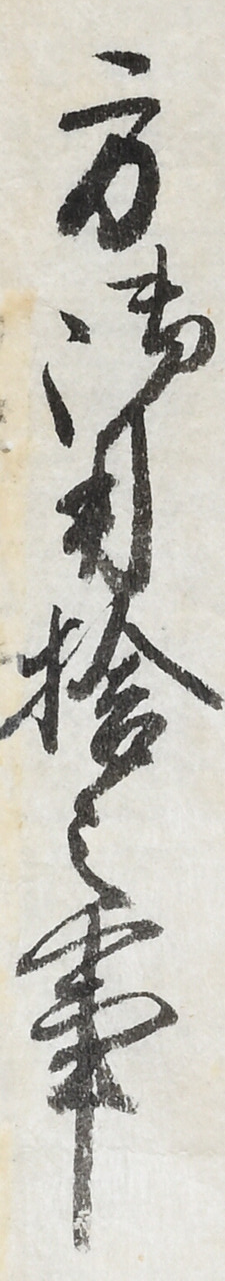方御用捨之事

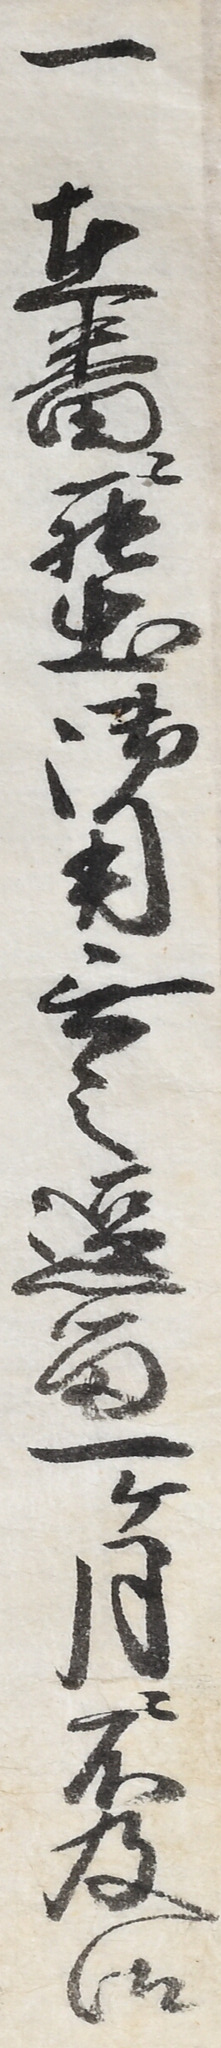一在番ニ罷出御用無之逗留一ヶ月ニ不及御
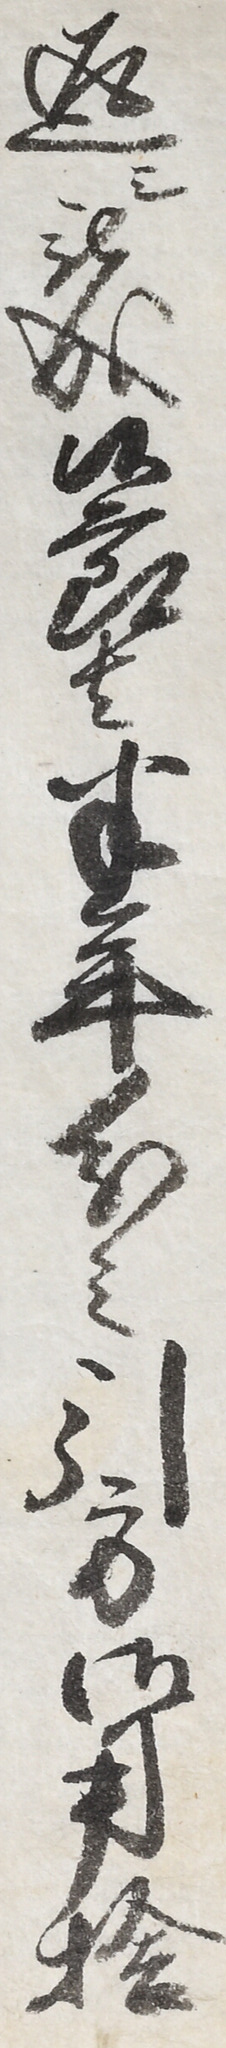返シ被成候節は半年分之引方御用捨
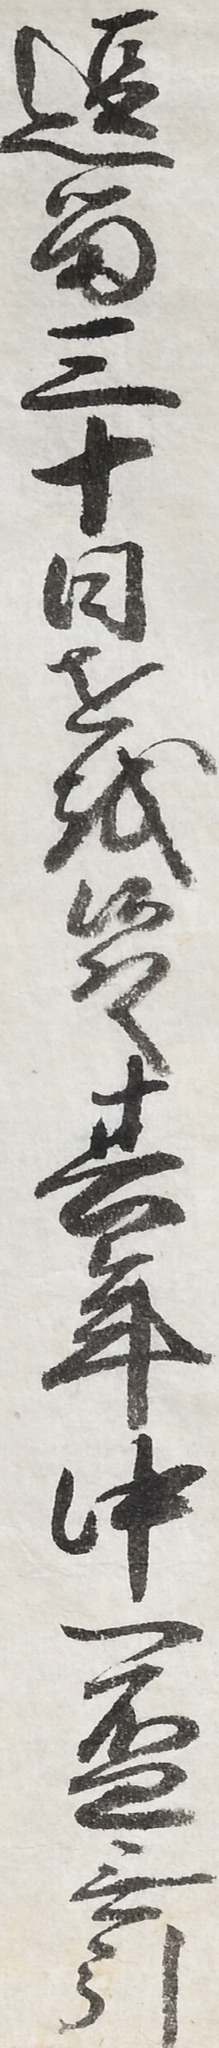逗留三十日を越候ハヽ其年中一盃無引
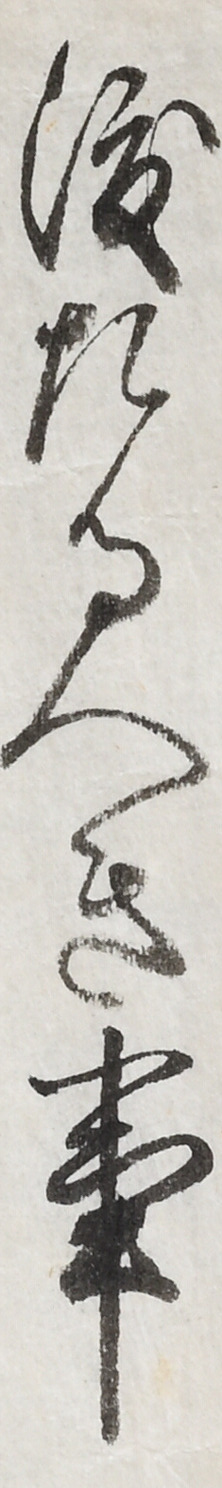渡たるへき事
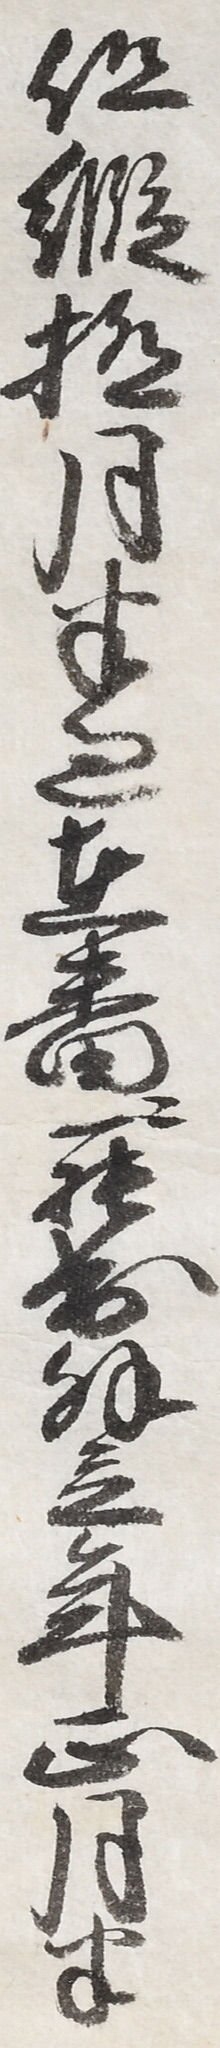但縦極月半過在番ニ罷出翌年正月半
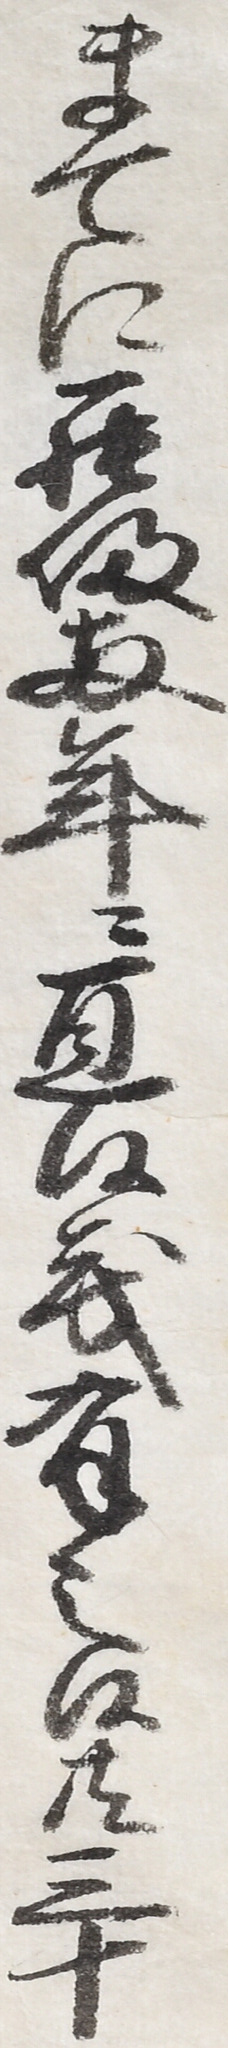まてに罷帰両年ニ亘候義有之候共三十
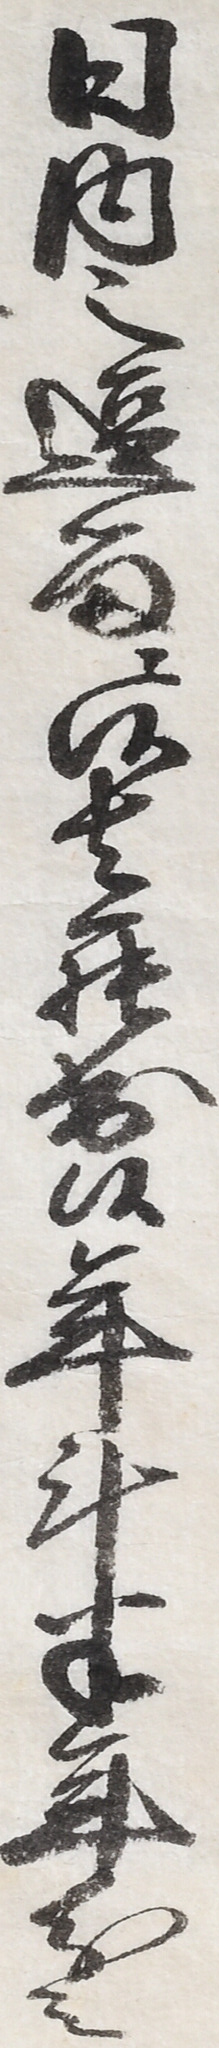日内之逗留ニ候は罷出候年計半年分之
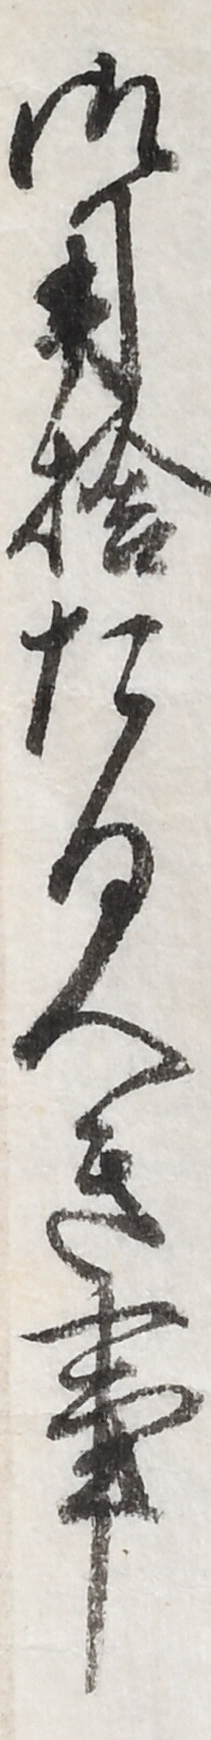御用捨たるへき事
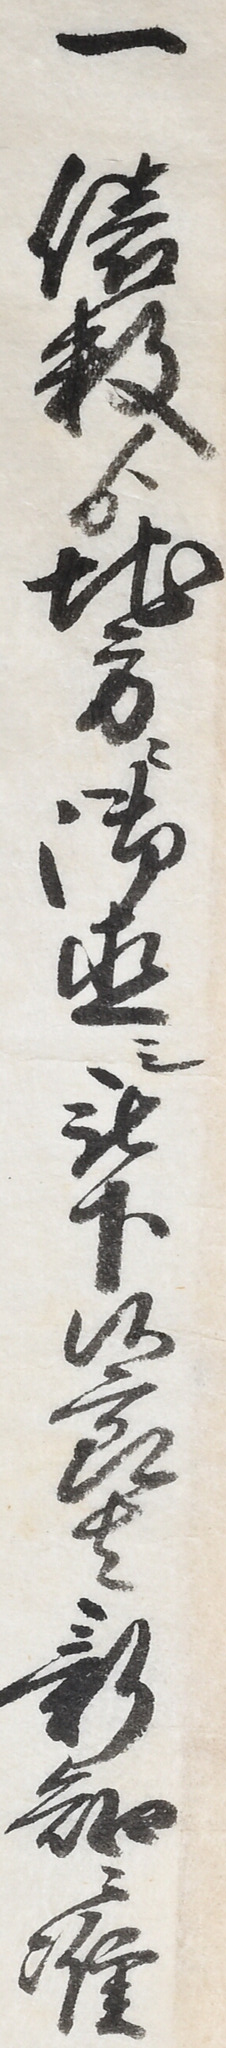一俵数ゟ地方ニ御直シ被下候節は新知ニ准
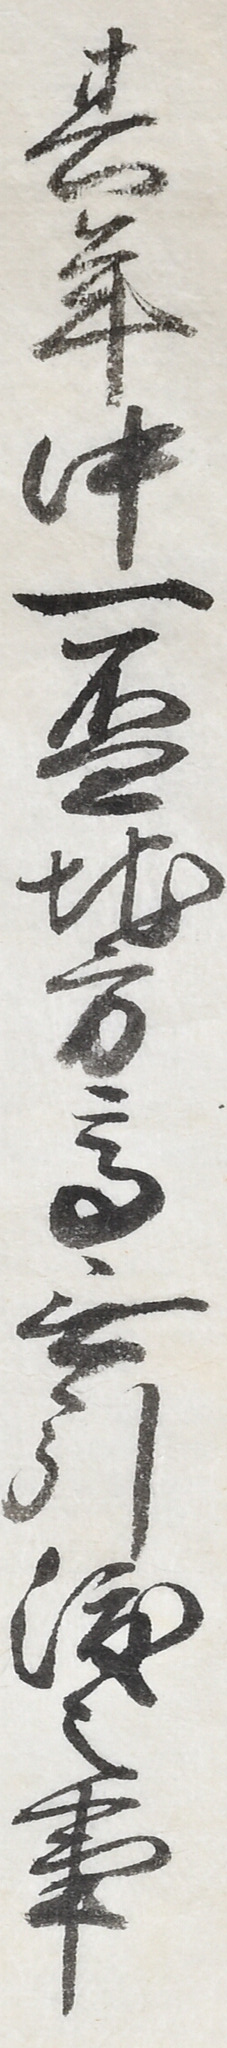其年中一盃地方高無引渡之事
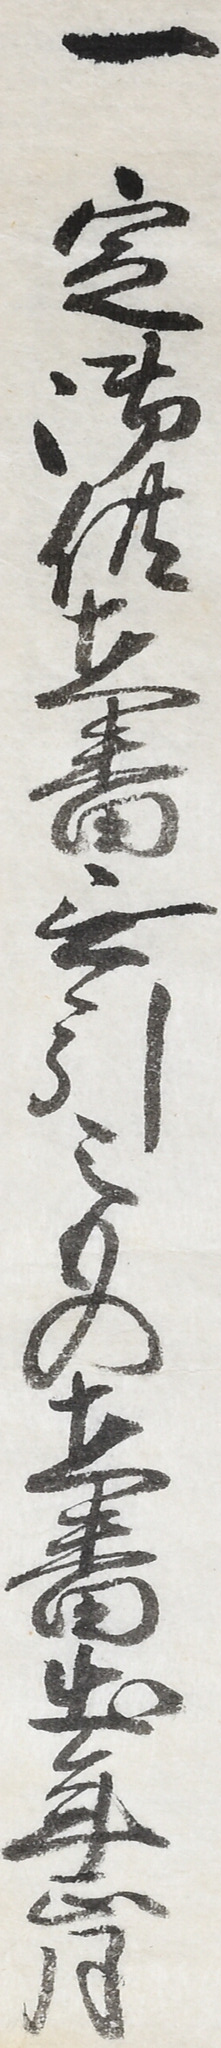一定御供在番無引之もの在番出年正月
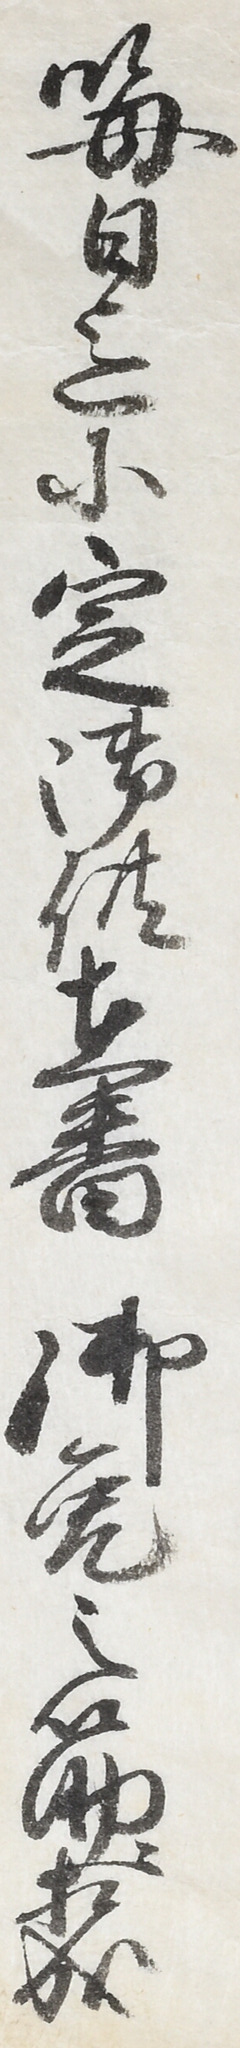晦日迄に定御供在番御免之筋ニ相成
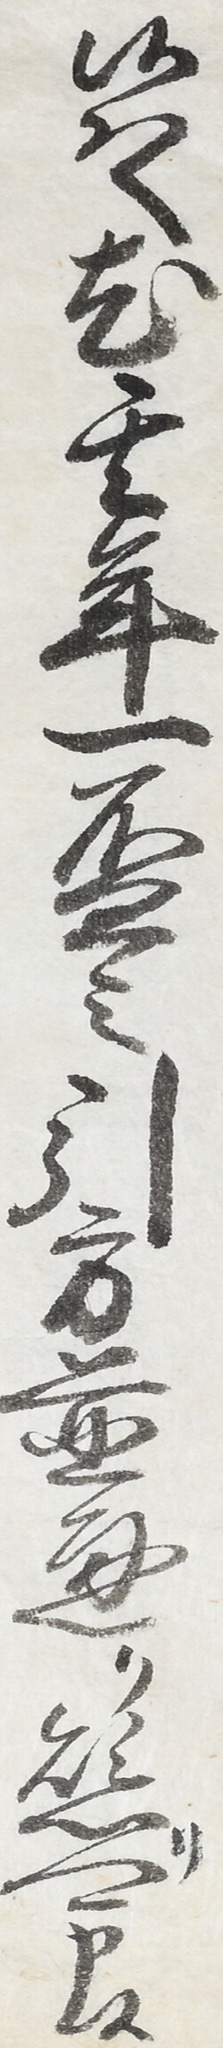候ハヽ尤其年一盃之引方並通リ懸リ可申候
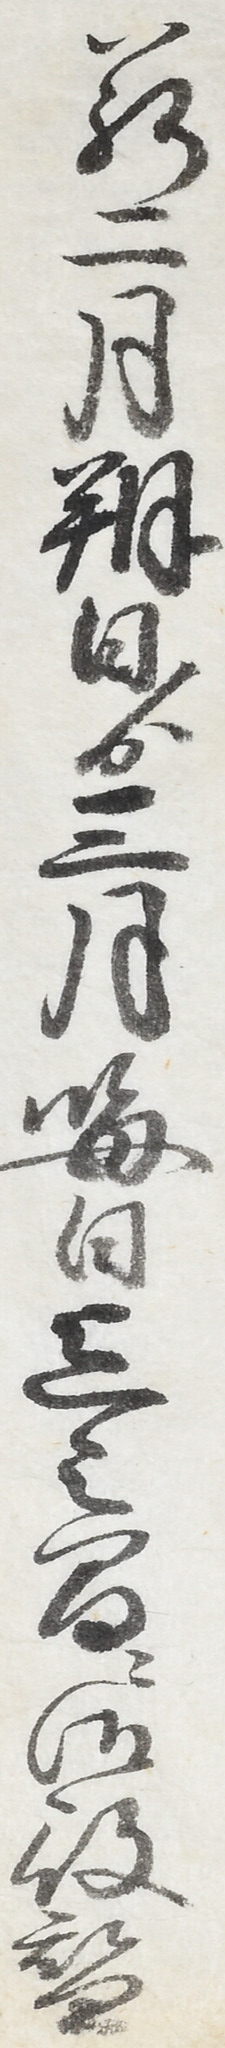若二月朔日ゟ三月晦日迄之間ニ御役替
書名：御給分渡り方定追加
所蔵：伊那市立高遠町図書館・合同会社AMANE
